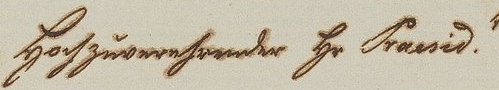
Hochzuverehrender Hr. Praesidt
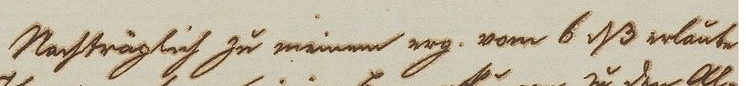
Nachträglich zu meinem erg. vom 6 dß erlaube
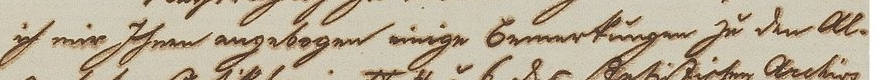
ich mir Ihnen angebogen einige Bemerkungen zu den Al-
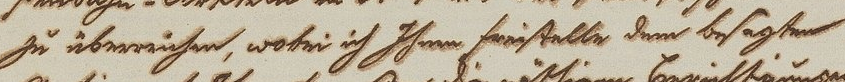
zu überreichen, wobei ich Ihnen freistelle dem besagten
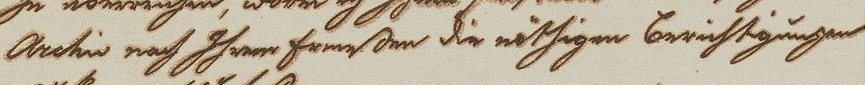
Archiv nach Ihrem Ermeßen die nöthigen Berichtigungen
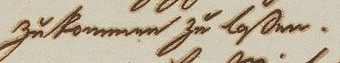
zukommen zu lassen.
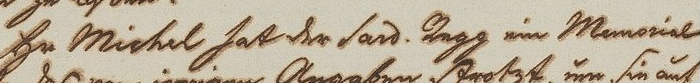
Hr. Michel hat der Sard. Regg. ein Memorial
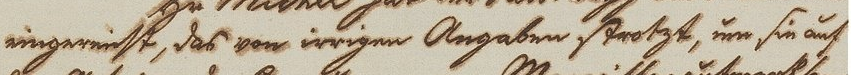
eingereicht, das von irrigen Angaben strotzt, um sie auf
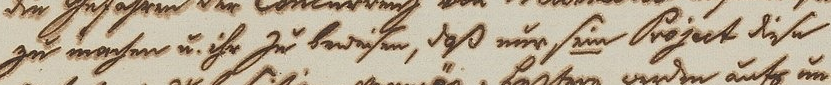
zu machen u. ihr zu beweisen, daß nur sein Project diese
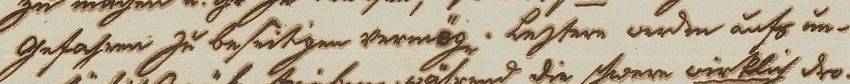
Gefahren zu beseitigen vermöge. Leztere werden aufs un-
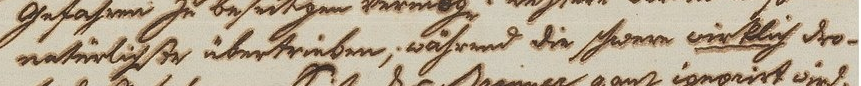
natürlichste übertrieben; während die schwere wirklich dro-
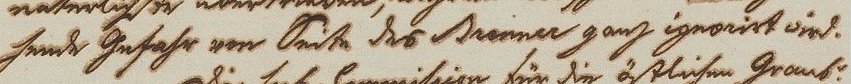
hende Gefahr von Seite des Brenner ganz ignorirt wird.
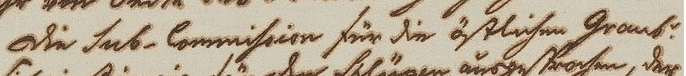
Die Sub-Commission für die östlichen Graub.-
